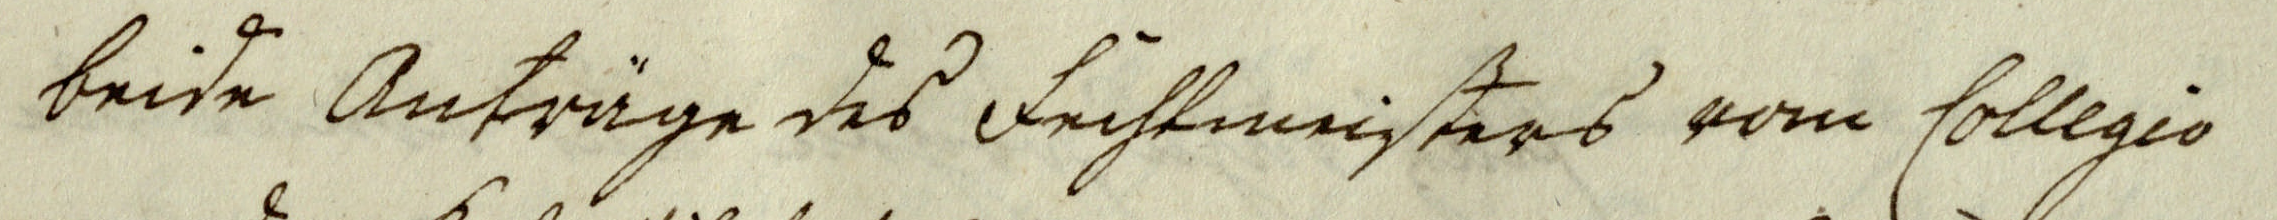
beide Anträge des Fechtmeisters vom Collegio
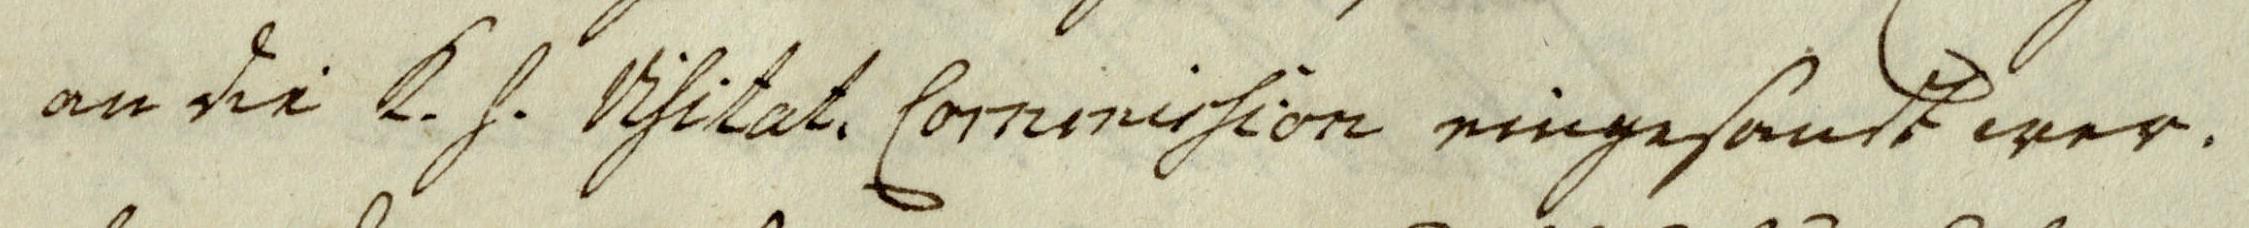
an die K. H. Visitat. Commission eingesandt wer¬
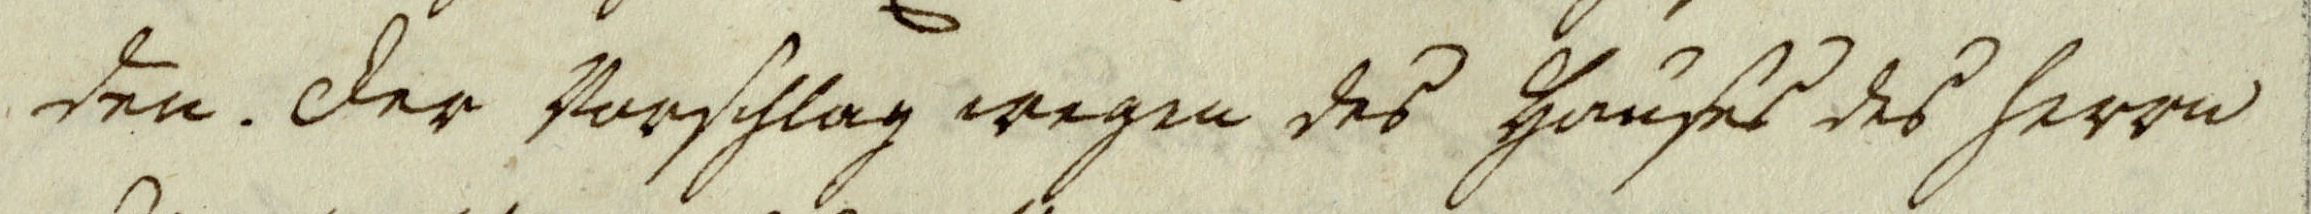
den. Der Vorschlag wegen des Hauses des Herrn
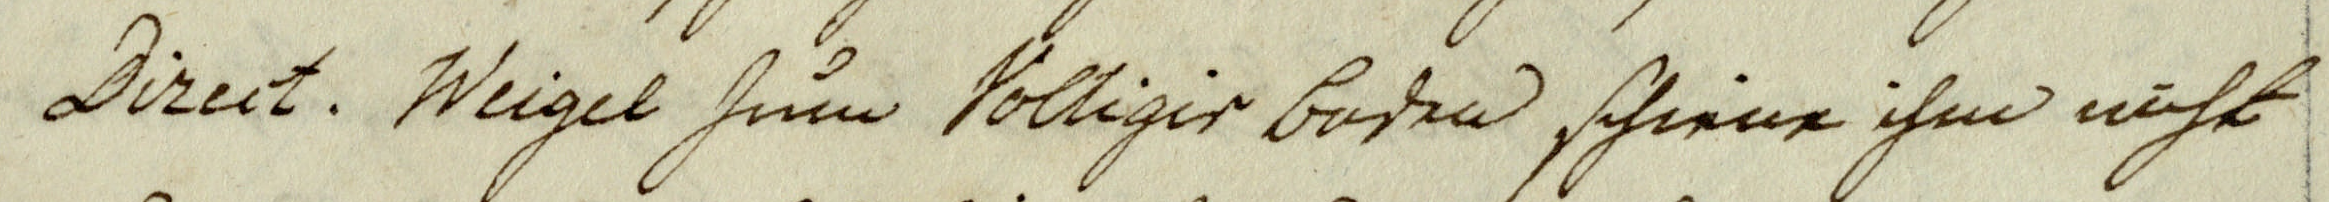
Direct. Weigel zum Voltigir Boden scheine ihm nicht
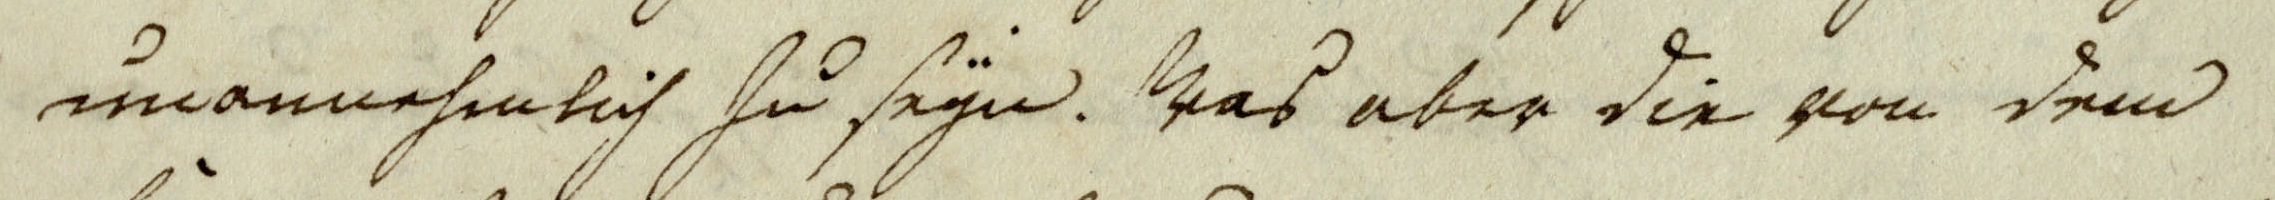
unannehmlich zu seÿn. Was aber die von dem
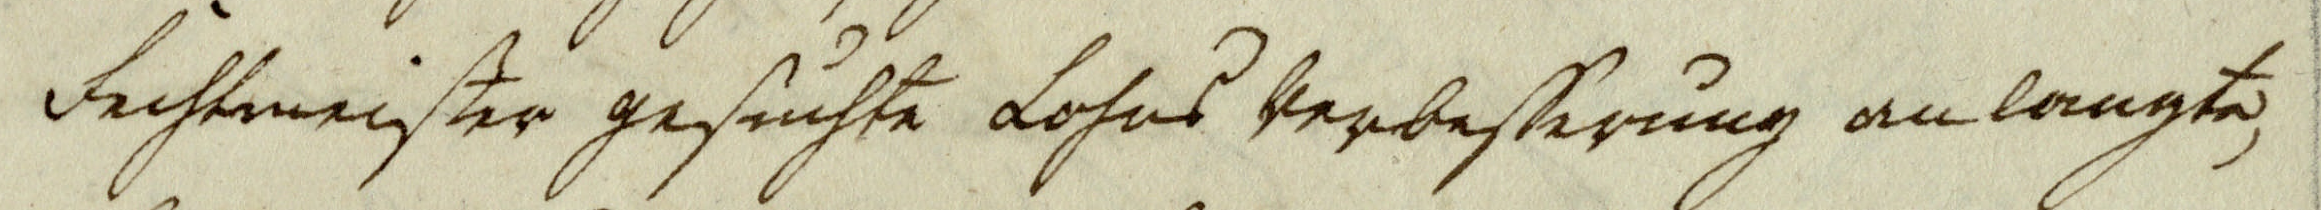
Fechtmeister gesuchte Lohns Verbesserung anlangte,
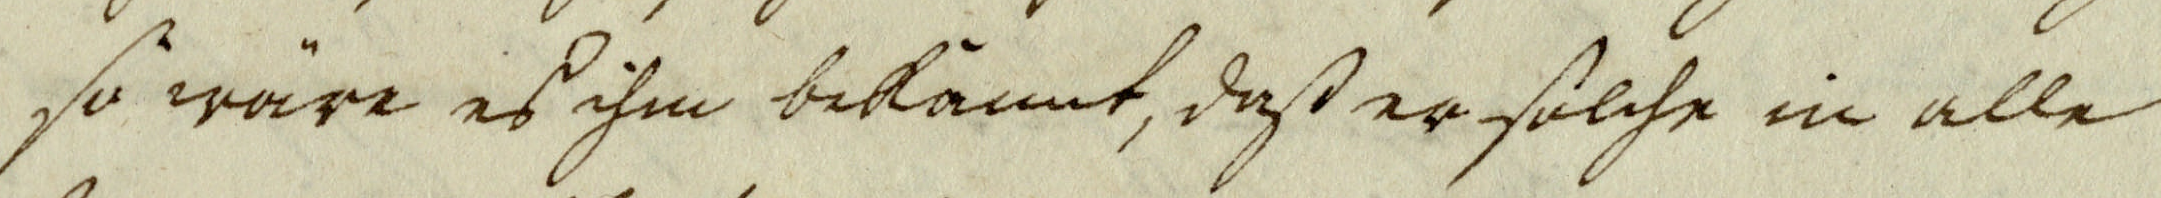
so wäre es ihm bekannt, daß er solche in alle
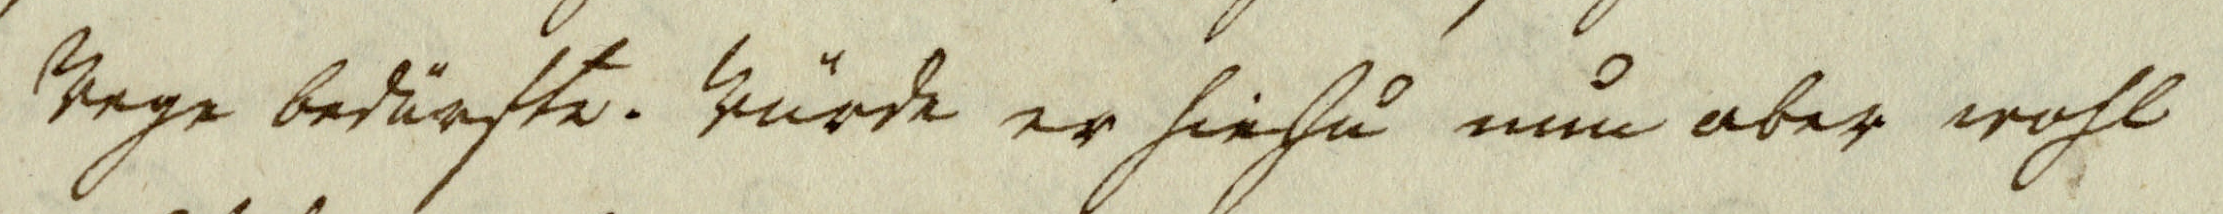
Wege bedürfte. Würde er hiezu nun aber wohl
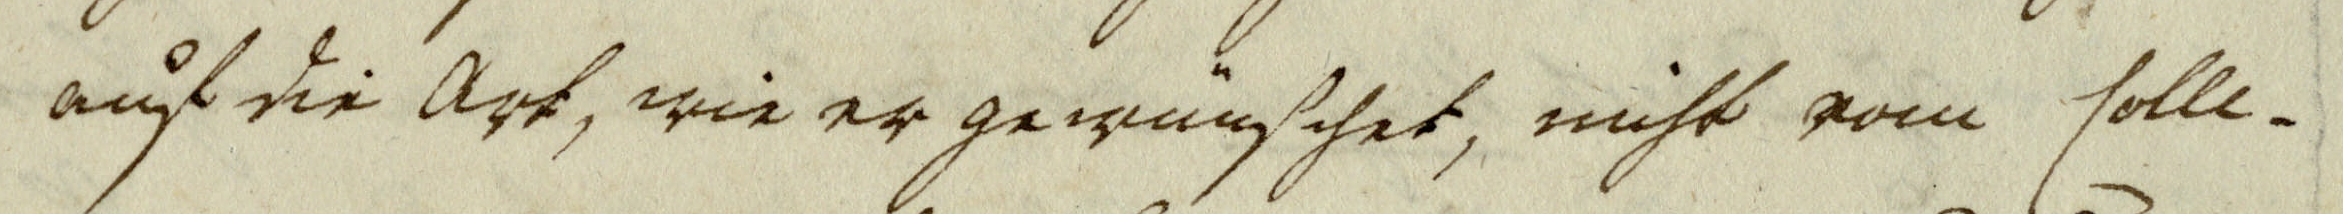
auf die Art, wie er gewünschet, nicht vom Colle¬
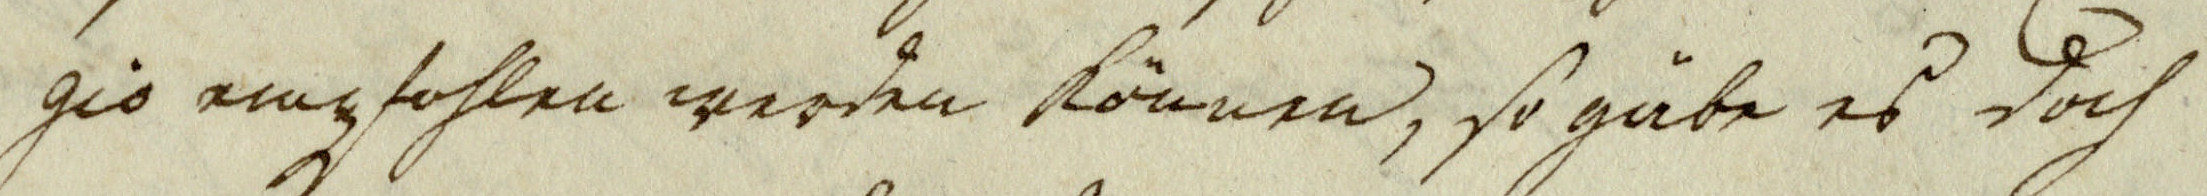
gio empfohlen werden können, so gäbe es doch
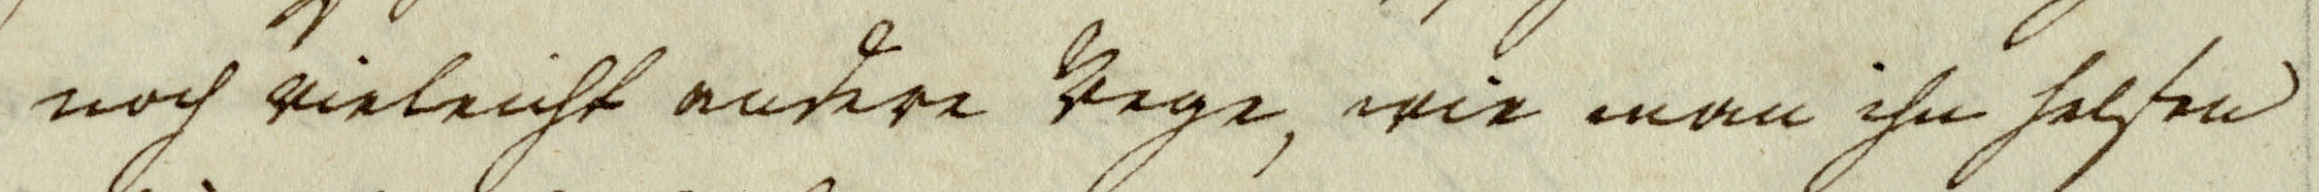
noch vieleicht andere Wege, wie man ihn helfen
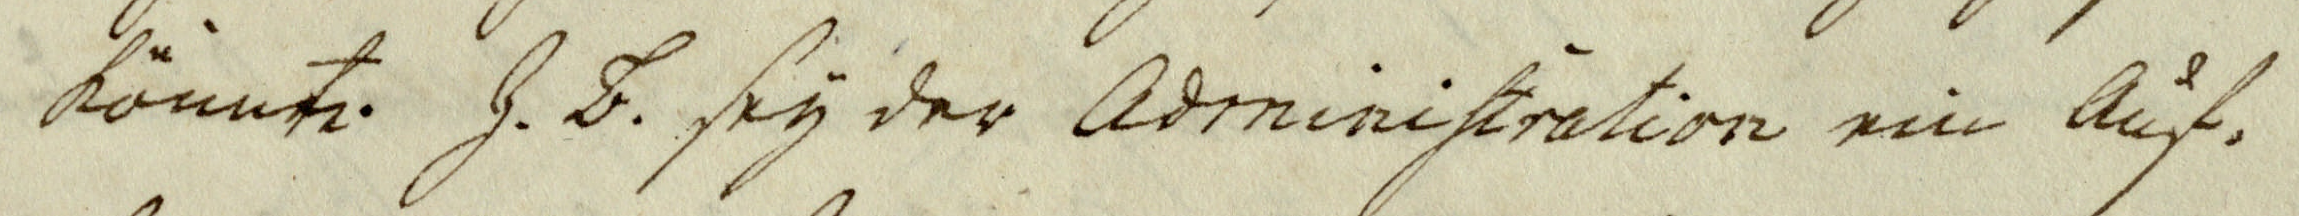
könnte. Z.B. seÿ der Administration ein Auf¬
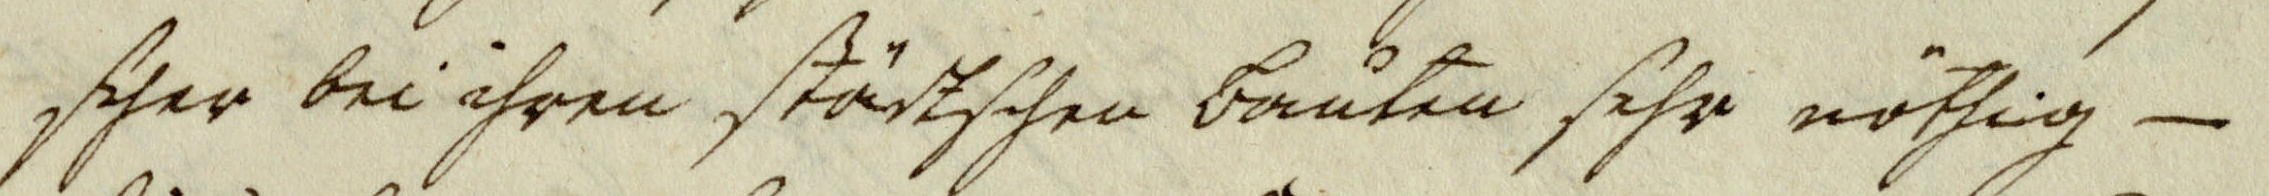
seher bei ihren städtischen Bauten sehr nöthig —
